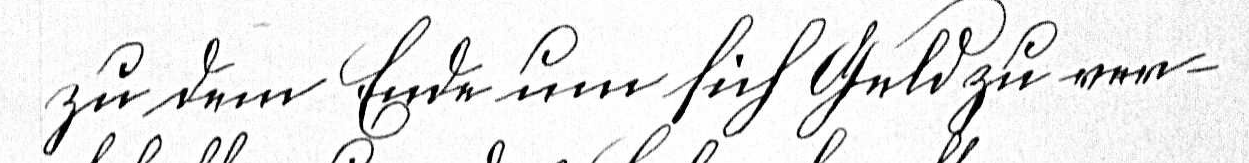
zu dem Ende um sich Geld zu ver¬
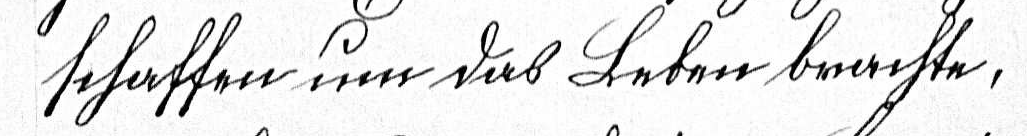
schaffen um das Leben brachte,
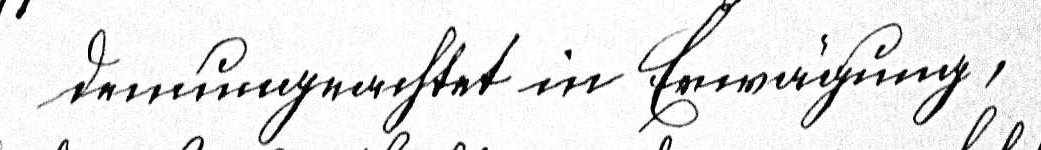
demungeachtet in Erwägung,
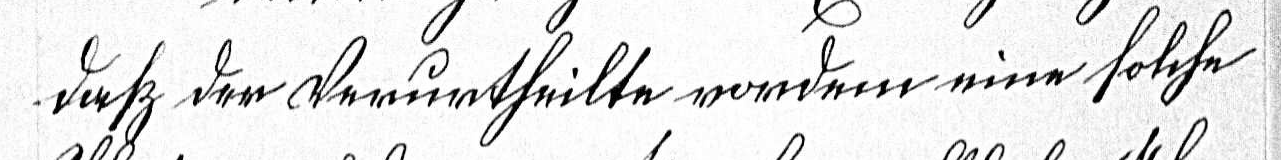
daß der Verurtheilte vordem eine solche
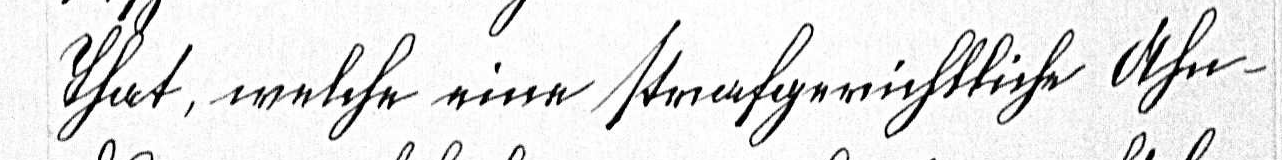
That, welche eine strafgerichtliche Ahn¬
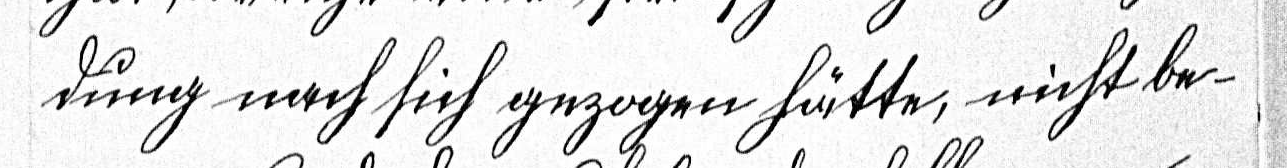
dung nach sich gezogen hätte, nicht be¬
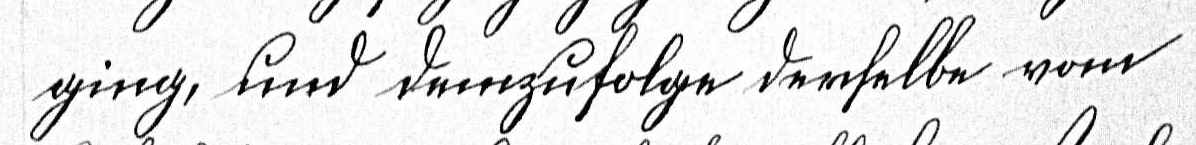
ging, und demzufolge derselbe vom
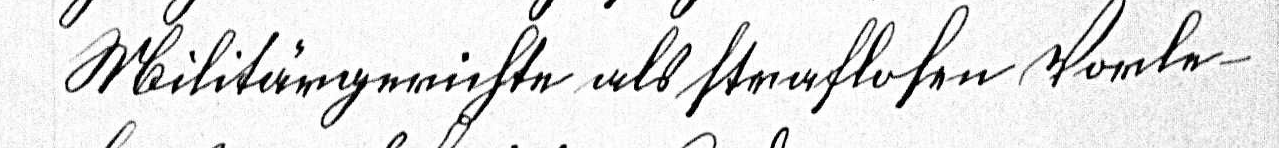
Militärgerichte als straflosen Vorle¬
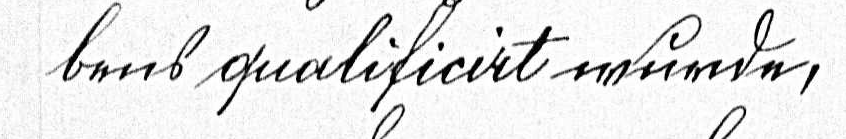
bens qualificirt wurde,
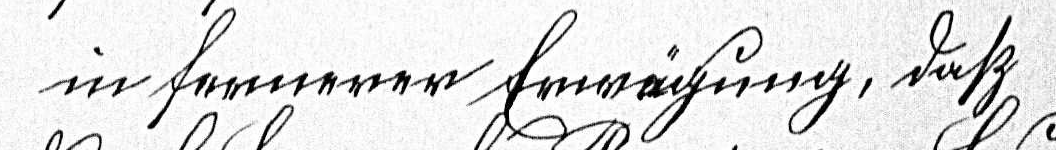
in fernerer Erwägung, daß
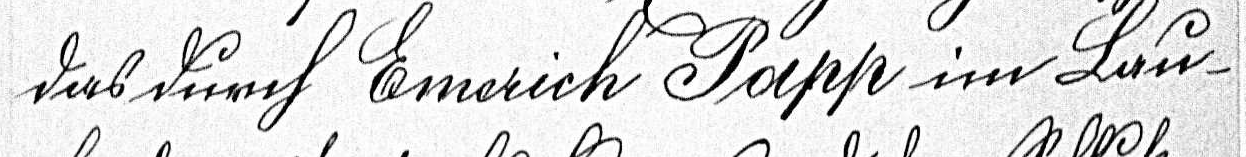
das durch Emerich Papp in Lau¬
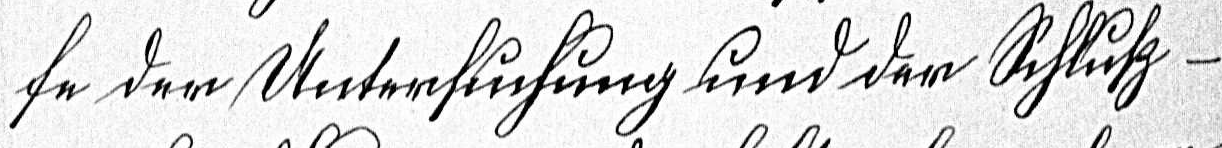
fe der Untersuchung und der Schluß¬
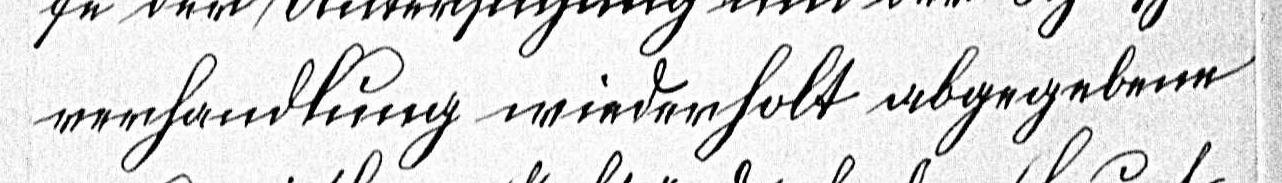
verhandlung wiederholt abgegebene
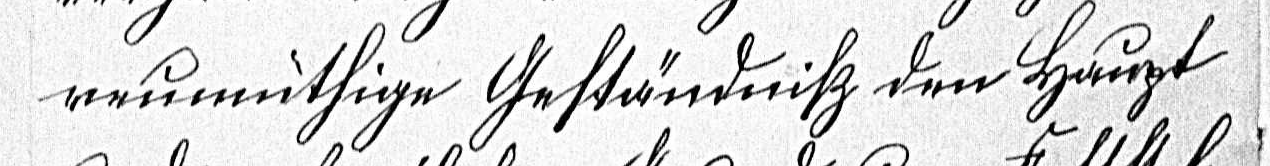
reumüthige Geständniß den Haupt
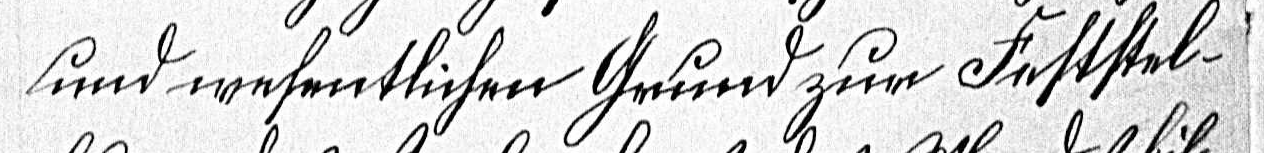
und wesentlichen Grund zur Feststel¬
